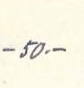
50
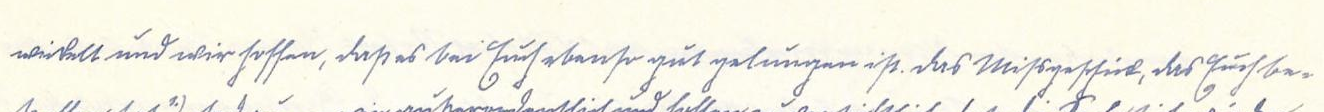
wickelt und wir hoffen, dass es bei Euch ebenso gut gelungen ist. Das Mißgeschick, das euch be-
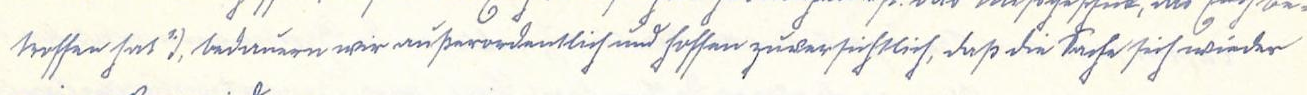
troffen hat, bedauern wir außerordentlich und hoffen zuversichtlich, daß die Sache sich wieder
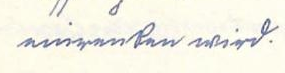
einrenken wird.
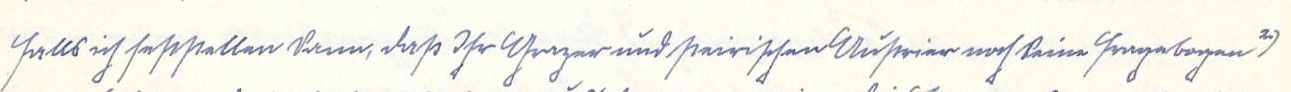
Falls ich feststellen kann, dass Ihr Grazer und steirischen Austrier noch keine Fragebogen 1)
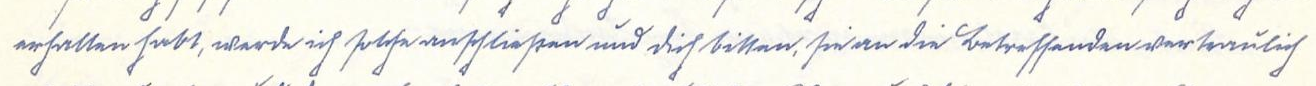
erhalten habt, werde ich solche anschließen und dich bitten, sie an die Betreffenden vertraulich
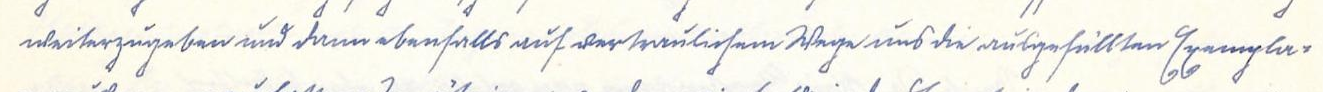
weiterzugeben und dann ebenfalls auf vertraulichem Wege uns die ausgefüllten Exempla-
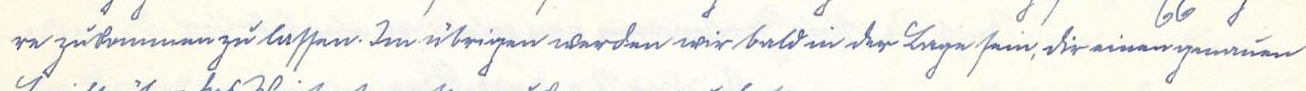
re zukommen zu lassen. Im übrigen werden wir bald in der Lage sein, die einen genauen
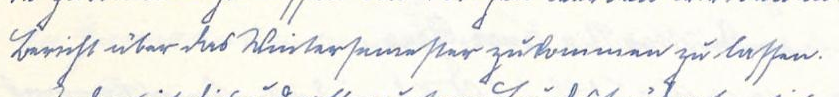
Bericht über das Wintersemester zukommen zu lassen.
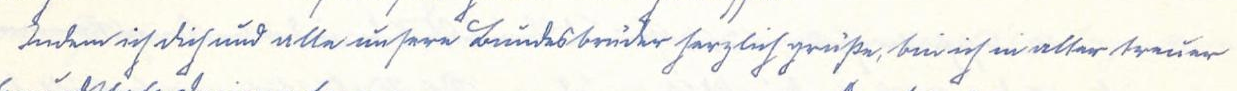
Indem ich Dich und alle unsere Bundesbrüder herzlich grüße, bin ich in alter treuer
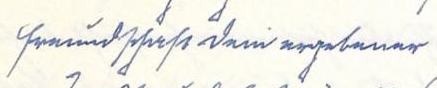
Freundschaft dein ergebener
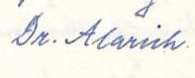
Dr. Alarich
